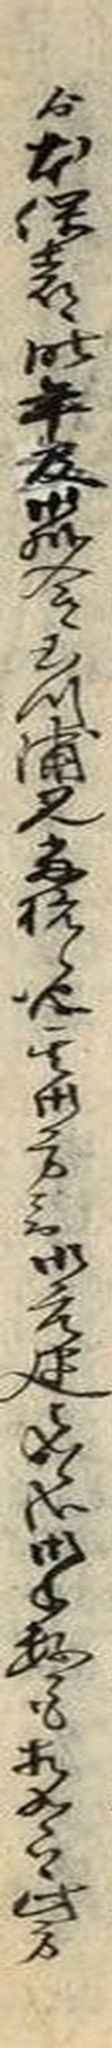ゟ本保表へ昨年及御掛合候玉川浦見当杭之儀其御方ニ而御取建被成候哉御手数ニも相成候ハヽ此方
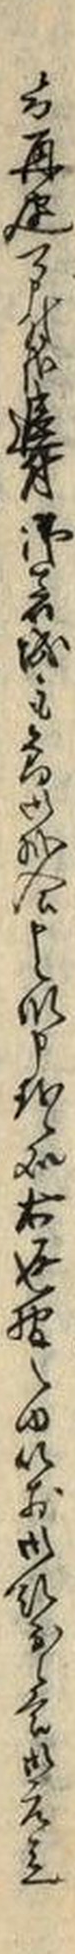ニ而再建可申付哉追付御着城ニも候間御掛合申候段申越候処右返報之由以前御領分之節御取立
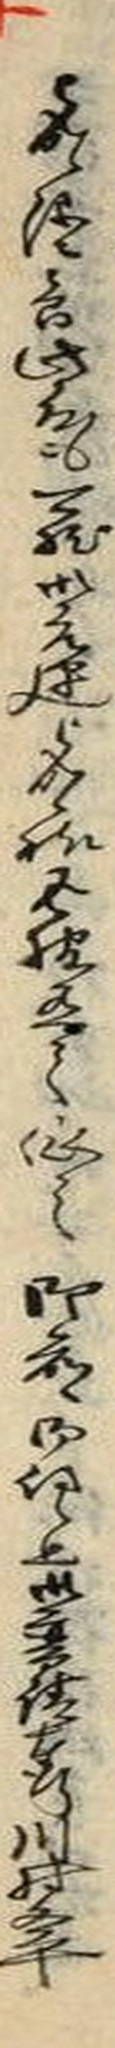被成候儀ニ候間此度も可然御取建被成候様返報有之依之御前へ御伺候上御普請奉行川村文平

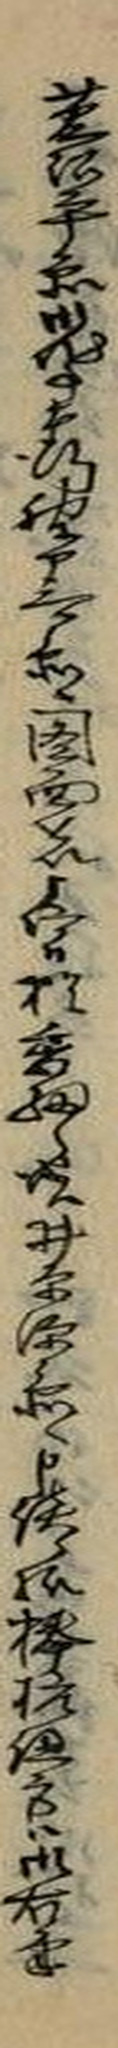菅沼平兵衛御作事奉行服部三郎兵衛へ図面を以被仰付猶委細之儀ハ井原源兵衛へ申談候様棒杭認方ハ御右筆
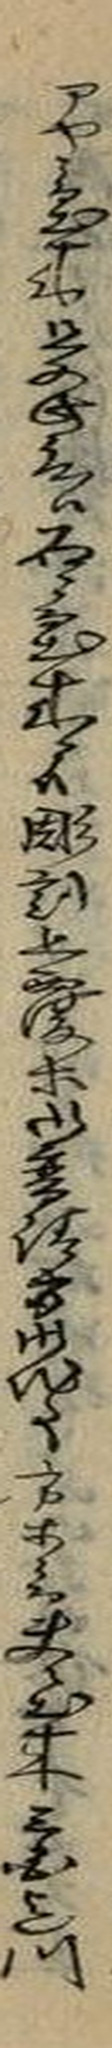部やニ而出来且又此度ハ石ニ而出来候ニ付彫刻上覆等御普請方御作事方等ニ而夫々出来三国迄川
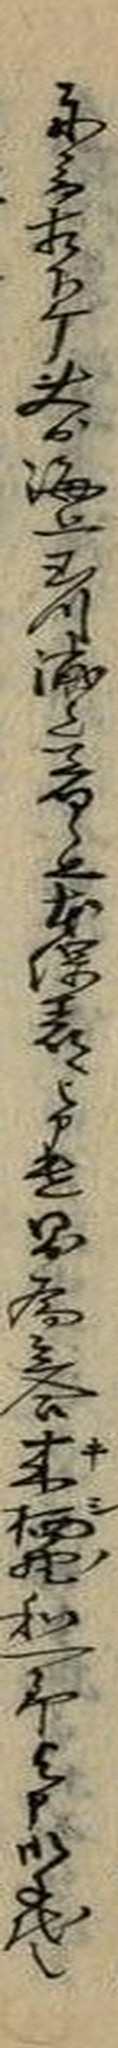舟ニ而相下ケ夫ゟ海上玉川浦迄着候上本保表へ被申遣則為立合来栖野和一郎与申御手代之
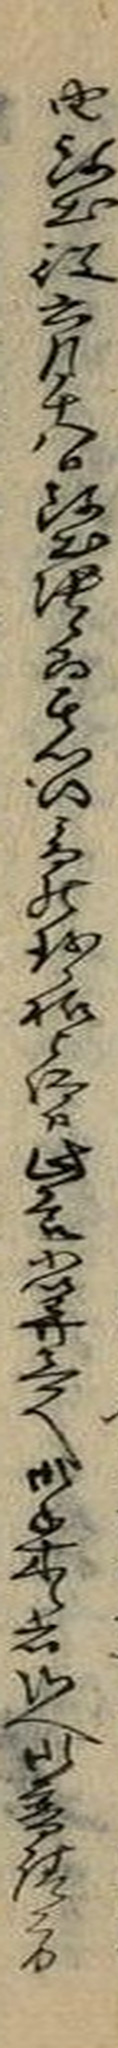由致出役六月十八日致出張候間其心得ニ而罷越候様被仰付此節小算壱人御手木之者弐人御普請方
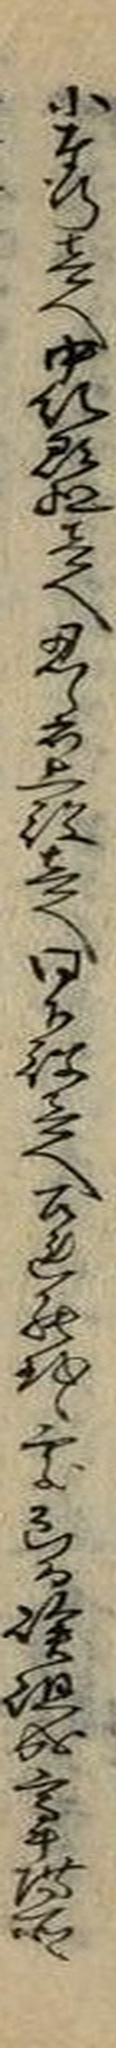小奉行壱人中領郡組壱人忍之者上役壱人同下役壱人召連罷越候処至而嶮岨成高ヰ場所へ
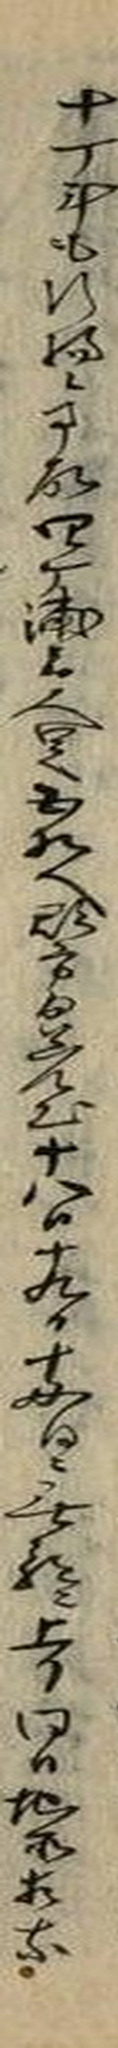十丁斗も引揚候事故四ケ浦ニ而人足五拾人郡方ゟ差出十八日十九日両日ニ無難ニ上り同日地所相な
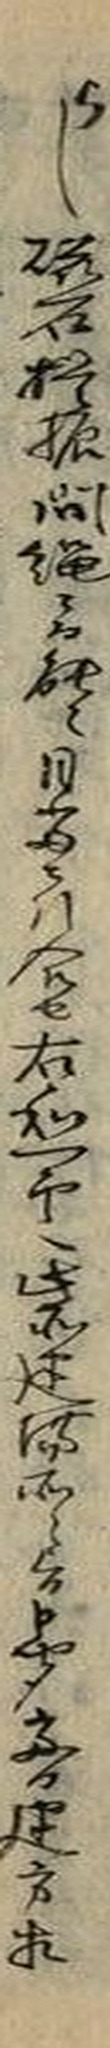らし磁石猶振間縄ニ而能々目当ニ引合セ右和一郎へ此所建場所之旨申聞当日建方相
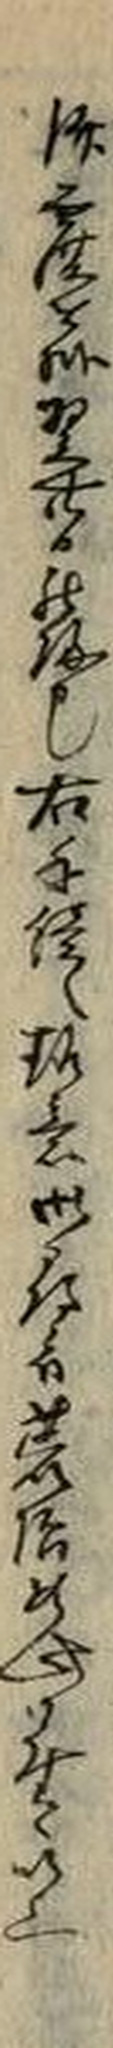済覆を掛翌廿日罷帰申候右手続之趣意御尋ニ付荒増如此御座候以上
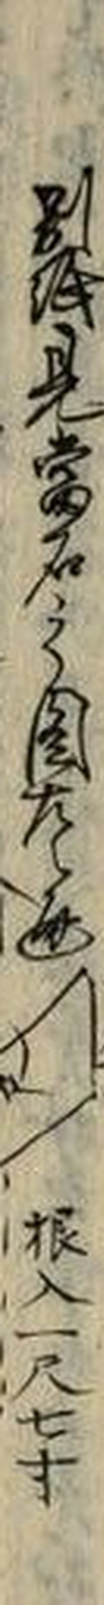別紙見当石之図左之通
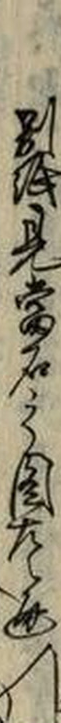別紙見当石之図左之通
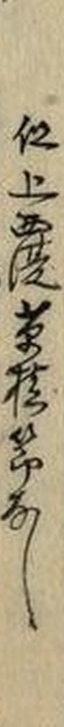但上覆草槙節なし
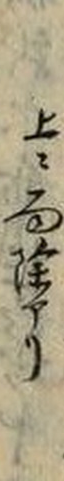上ニ雨除アリ
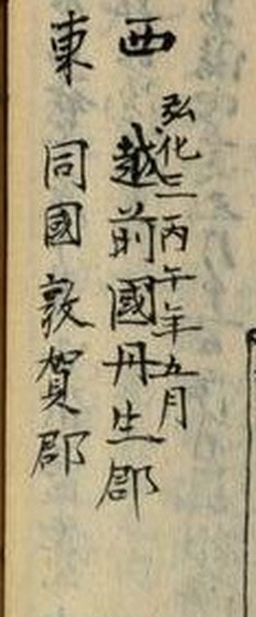越前国丹生郡
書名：御国他国諸事之部
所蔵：福井県文書館 Fukui Prefectural Archives
